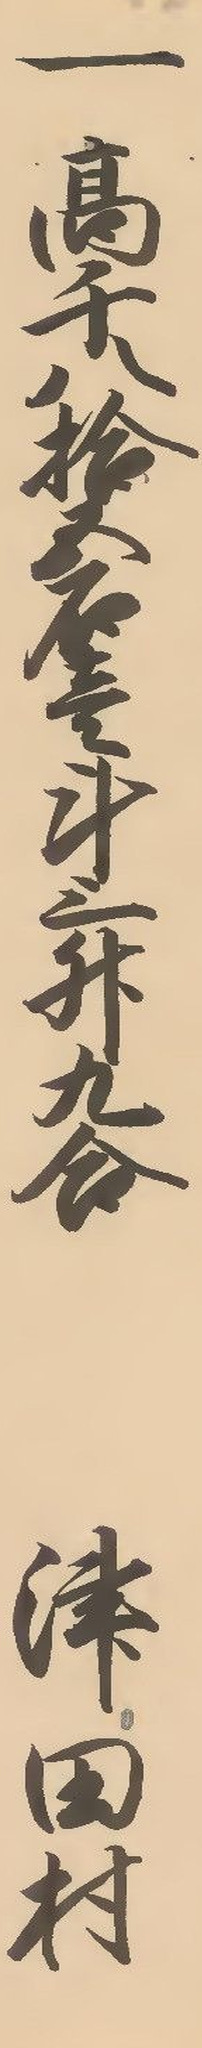一高千八拾五石壱斗三升九合津田村

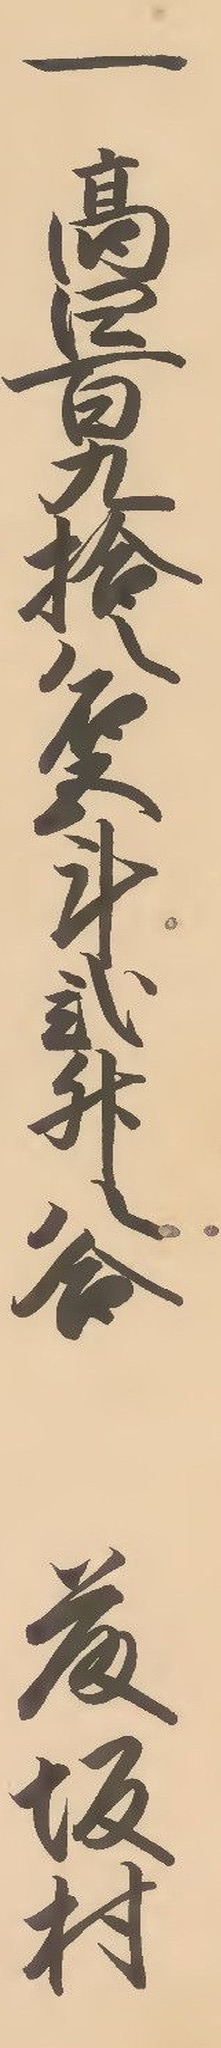一高四百九拾八石五斗弐升八合藤坂村
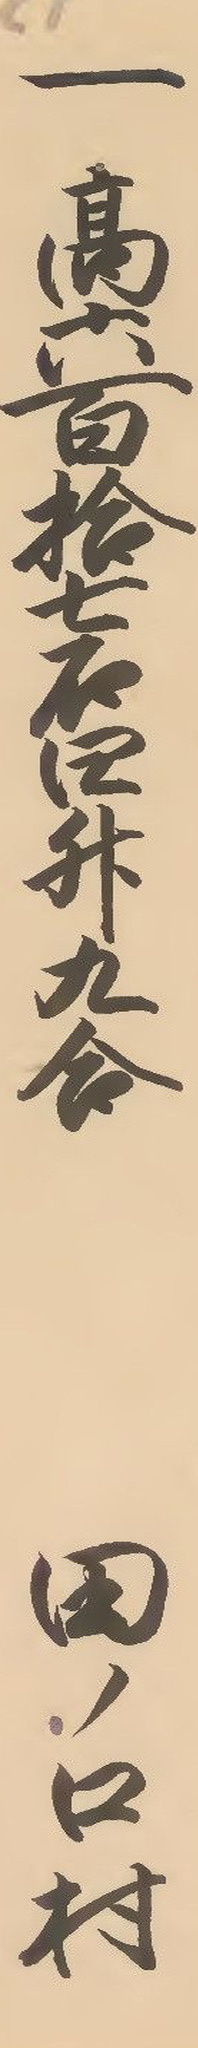一高六百拾七石四升九合田ノ口村
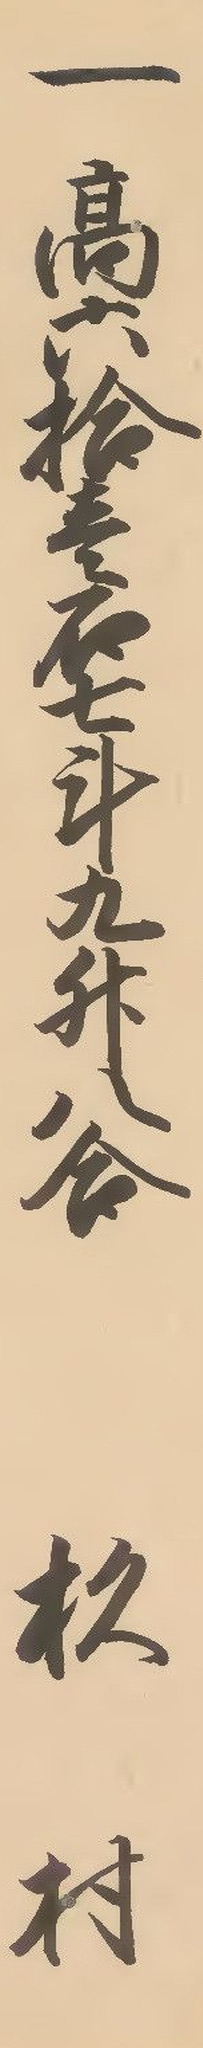一高六拾壱石七斗九升八合杉村
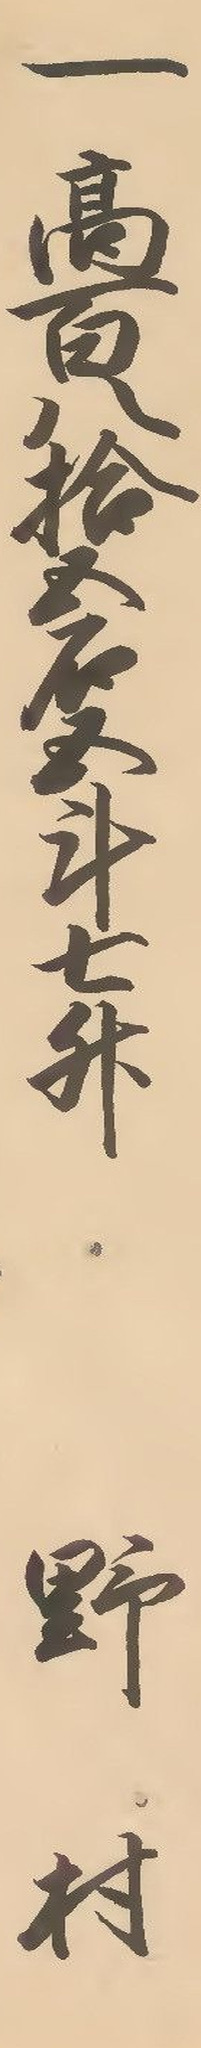一高百八拾五石五斗七升野村
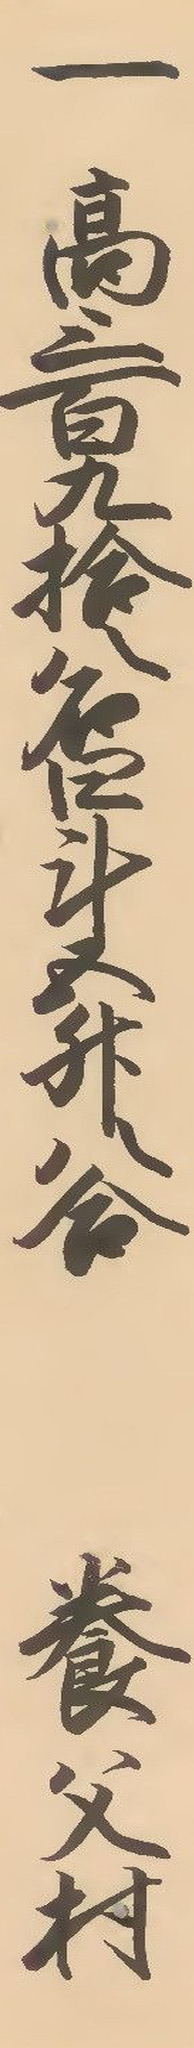一三百九拾八石四斗五升八合養父村
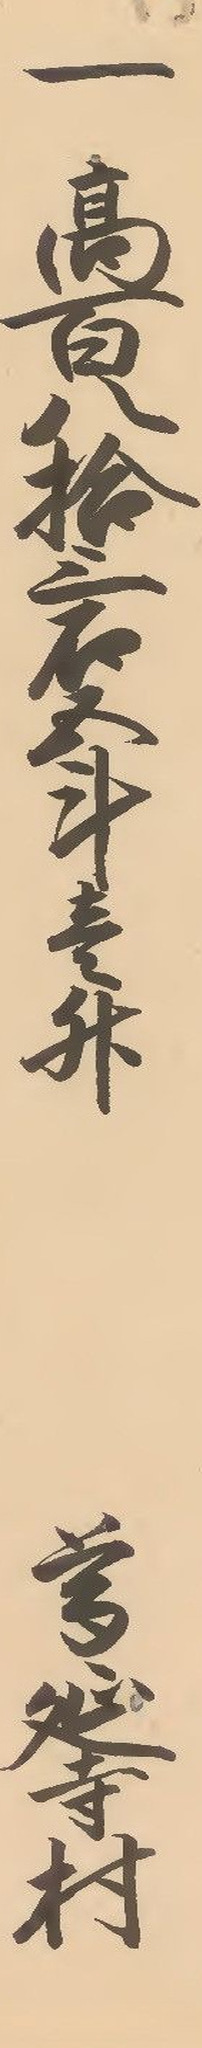一高百八拾三石五斗壱升尊延寺村
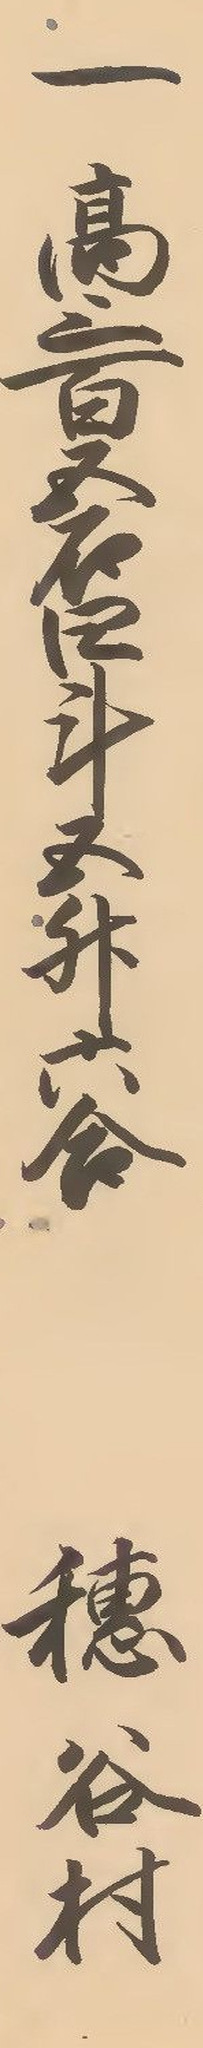一高三百五石四斗五升六合穂谷村

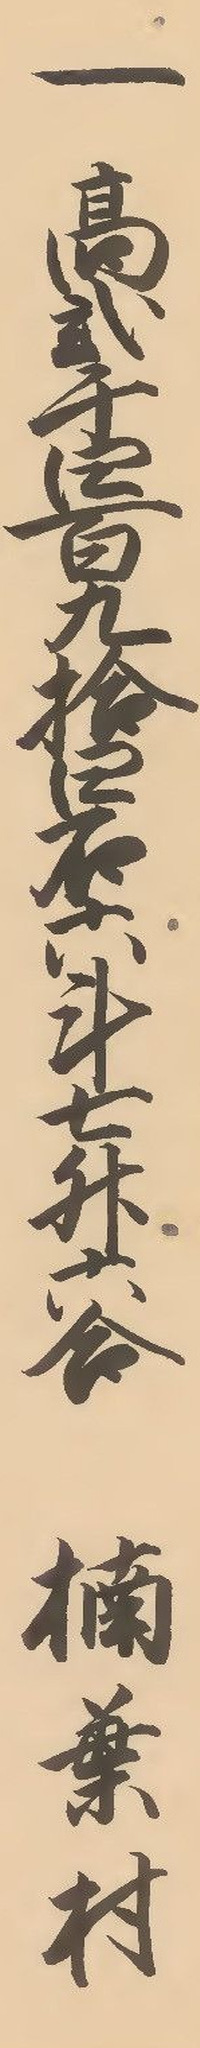一高弐千四百九拾四石六斗七升六合楠葉村
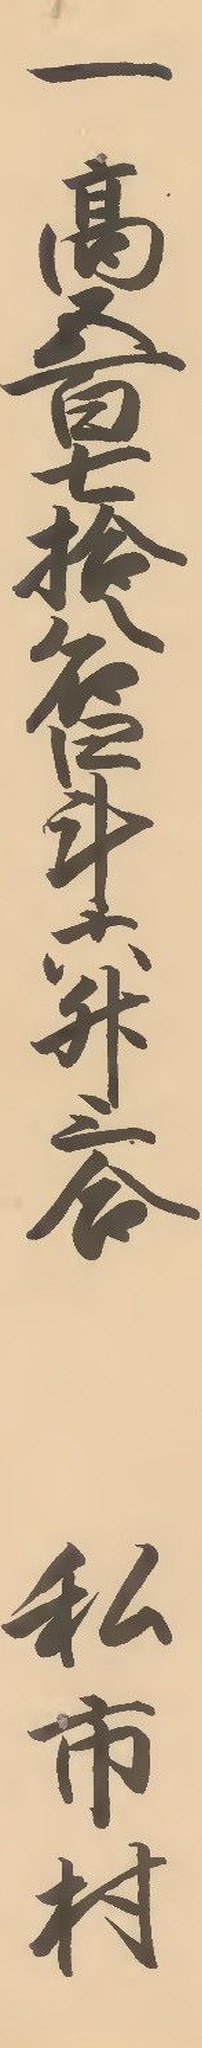一高五百七拾八石四斗六升三合私市村
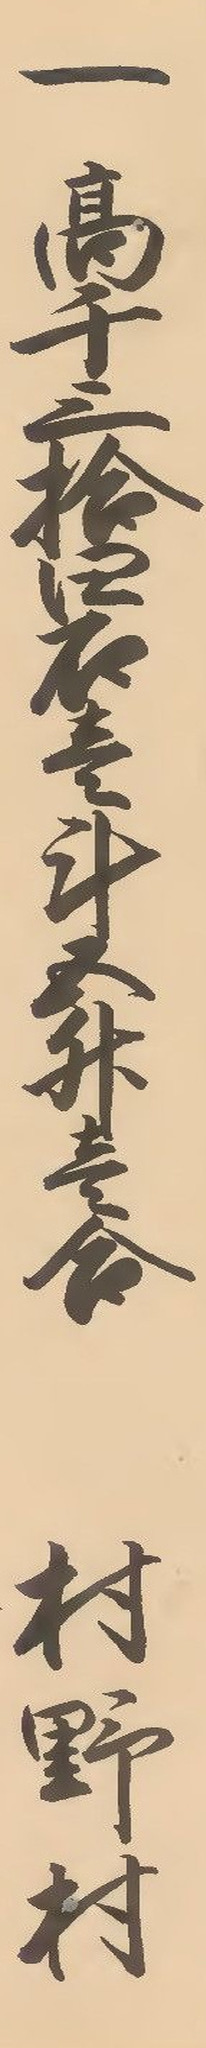一高千三拾四石壱斗五升壱合村野村
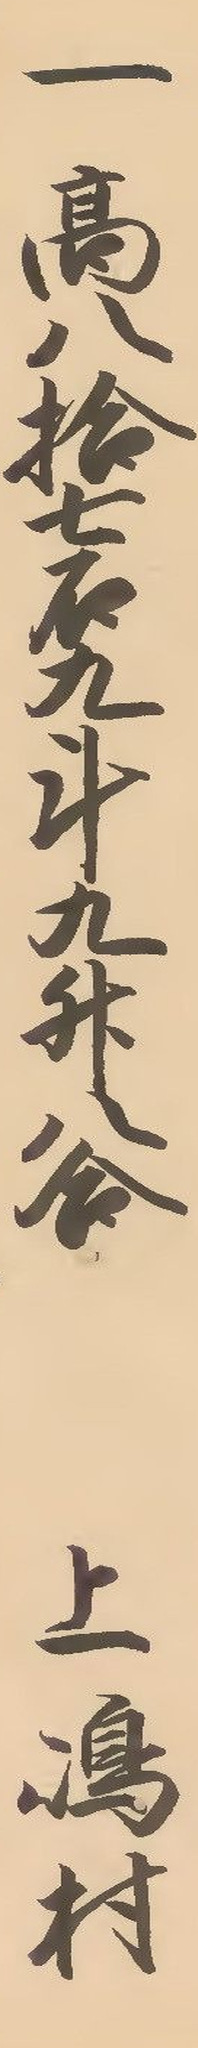一高八拾七石九斗九升八合上島村
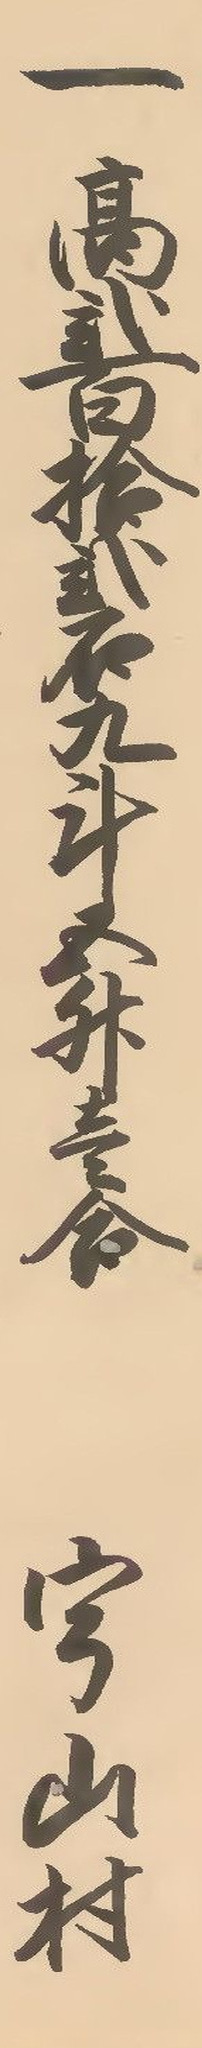一高弐百拾弐石九斗五升壱合宇山村
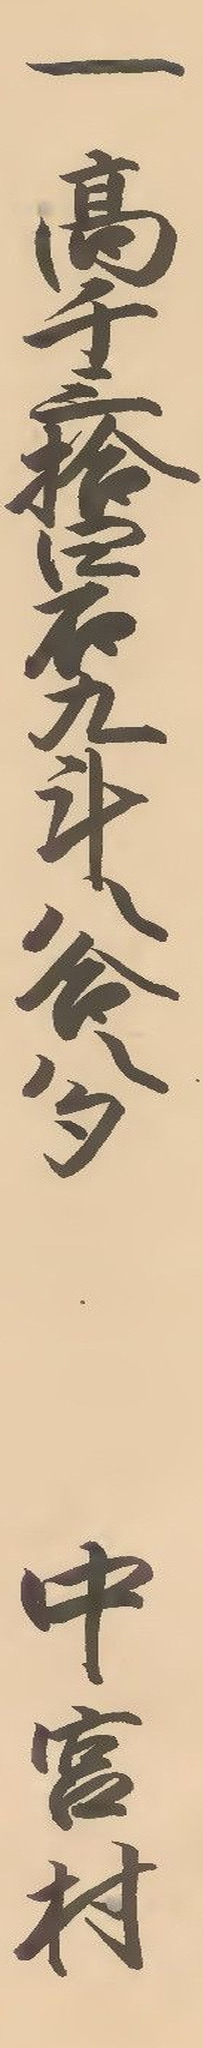一高千三拾四石九斗八合八勺中宮村
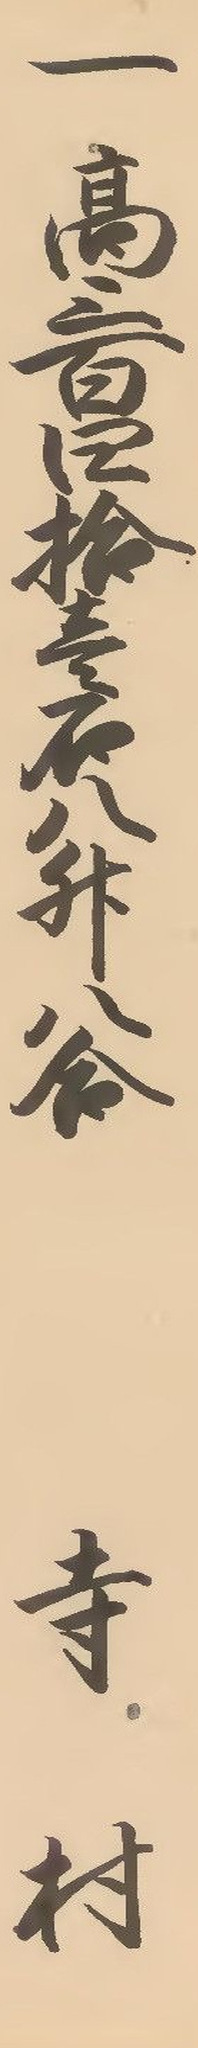一高三百四拾壱石八升八合寺村

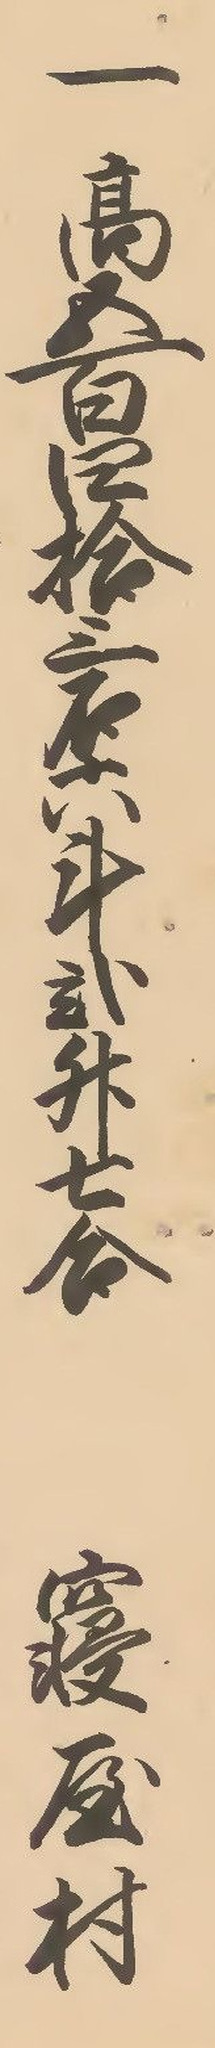一高五百四拾三石六斗弐升七合寝屋村
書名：河内国郷帳
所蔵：国立公文書館 National Archives of Japan
